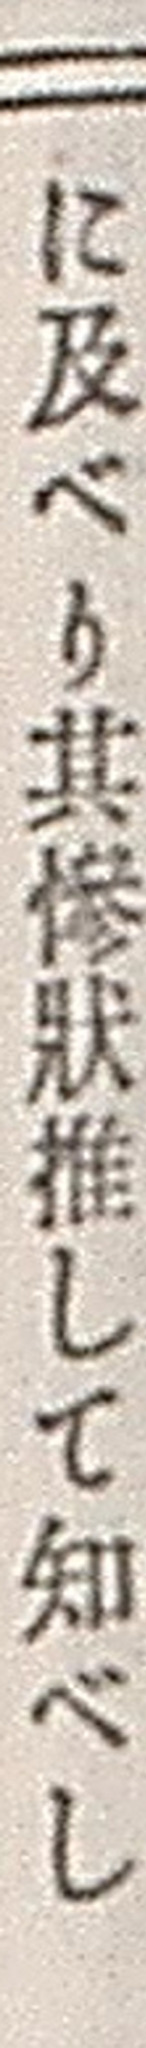に及べり其惨状推して知べし
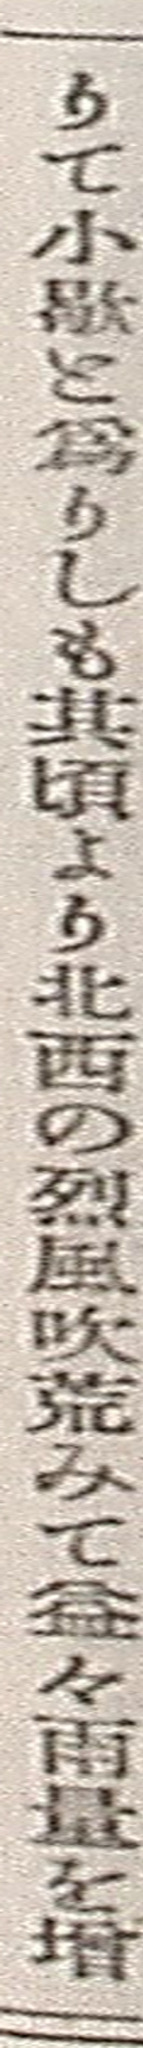りて小歇と為りしも其頃より北西の烈風吹荒みて益々雨量を増
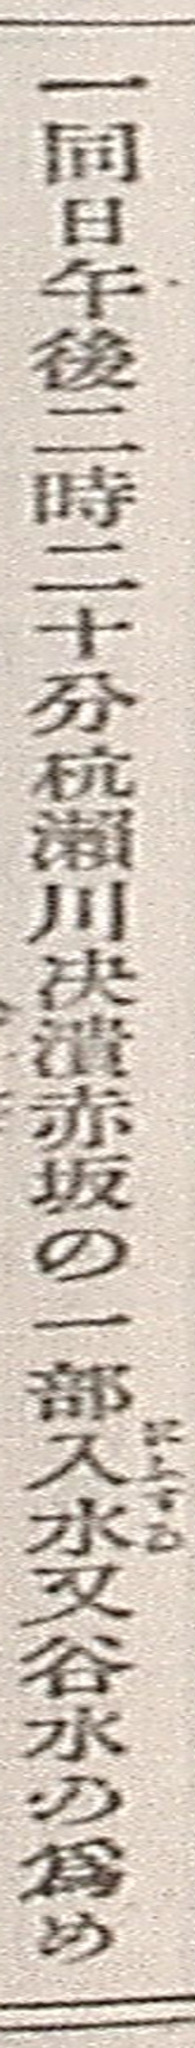一同日午後二時二十分杭瀬川决潰赤坂の一部入水又谷水の為め
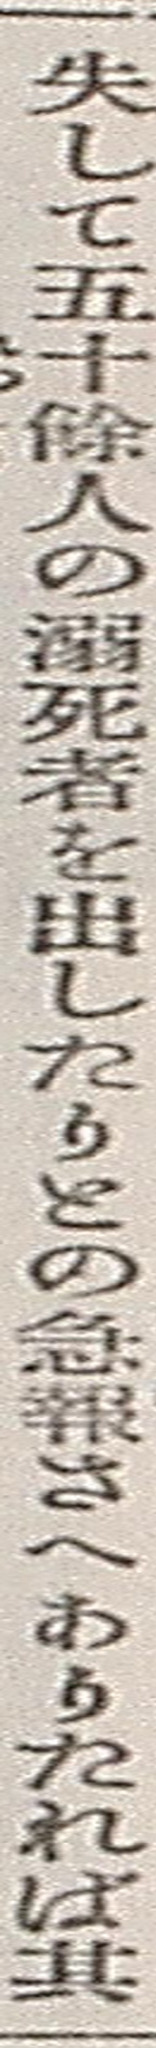失して五十餘人の溺死者を出したりとの急報さへありたれば其
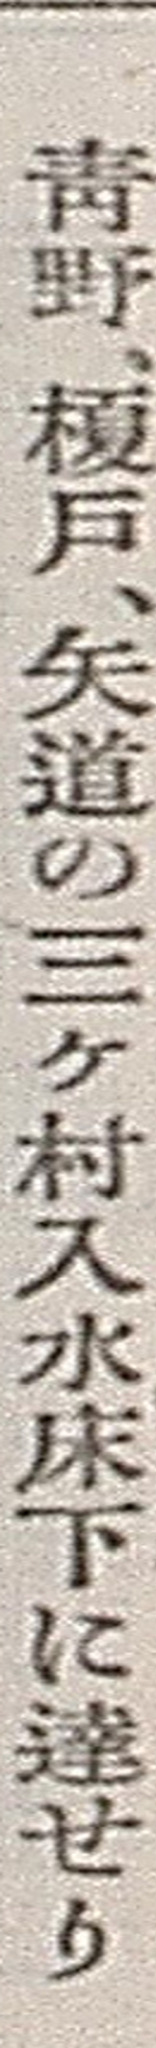青野、榎戸、矢道の三ヶ村入水床下に達せり
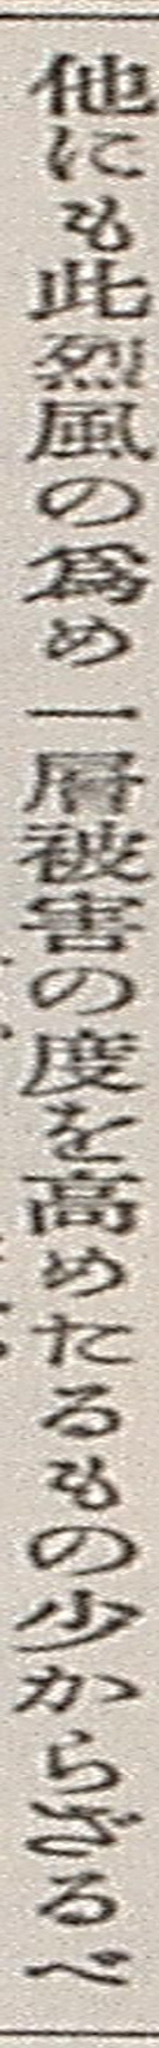他にも此烈風の為め一層被害の度を高めたるもの少からざるべ
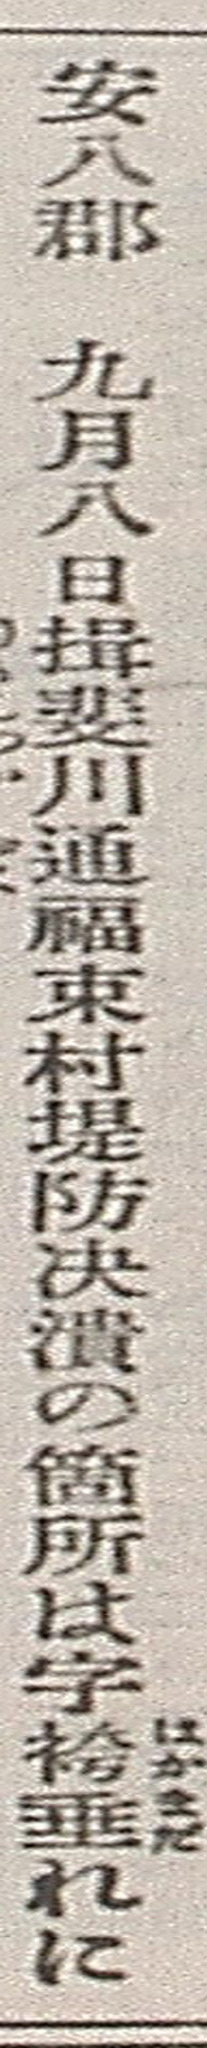安八郡九月八日揖斐川通福束村堤防决潰の箇所は字袴垂れに
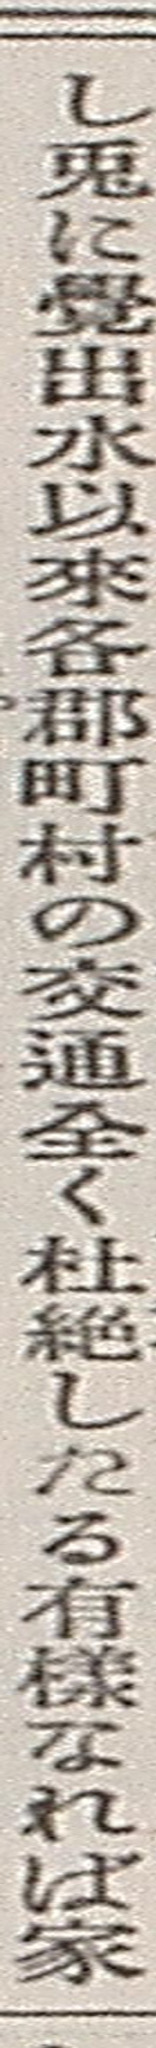し兎に覚出水以来各郡町村の交通全く杜絶したる有様なれば家
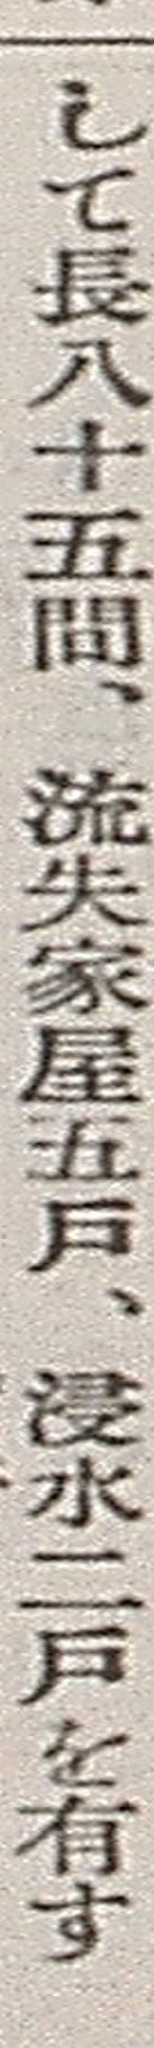して長八十五間、流失家屋五戸、浸水二戸を有す
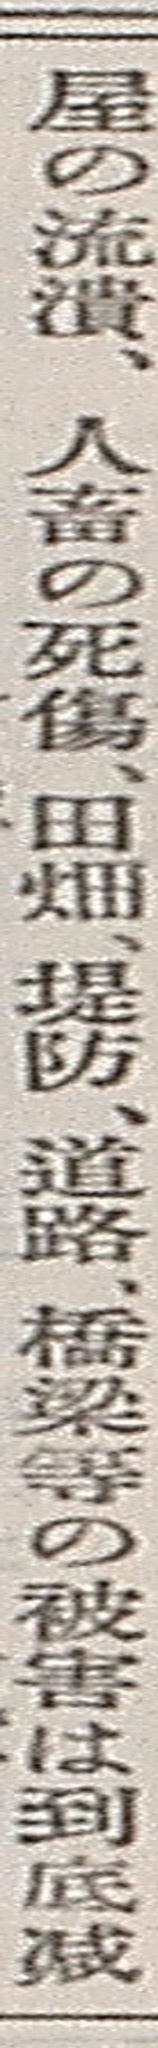屋の流失、人畜の死傷、田畑、堤防、道路、橋梁等の被害は到底減
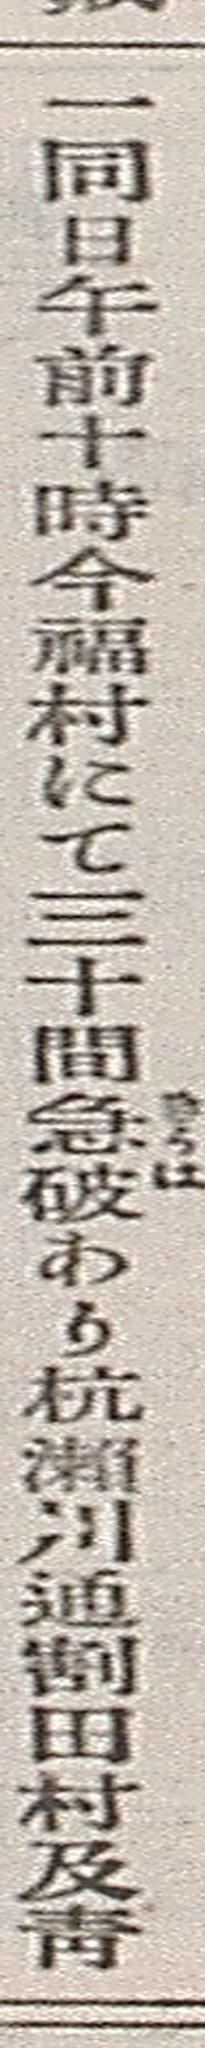一同日午前十時今福村にて三十間急破あり杭瀬川通割田村及青
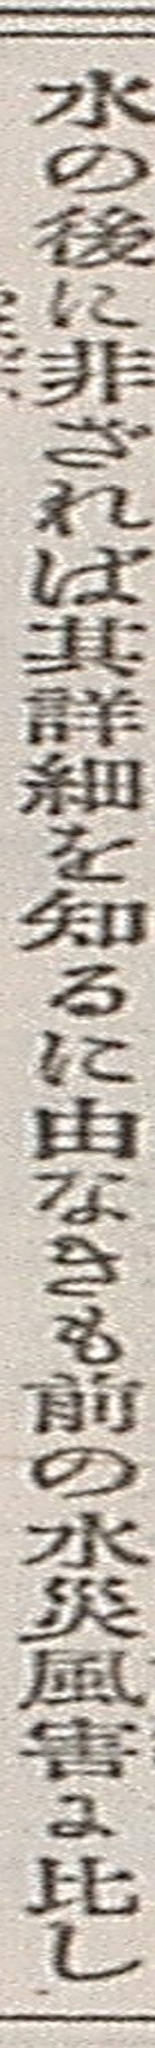水の後の非ざれば其詳細を知るに由なきも前の水災風害に比し
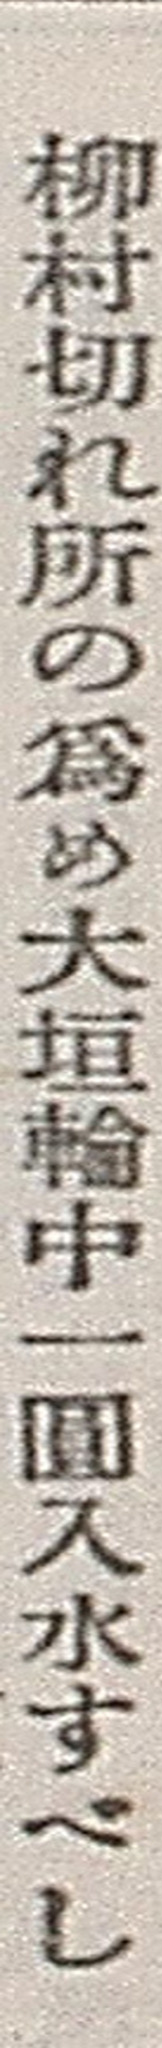柳村切れ所の為め大垣輪中一円入水すべし
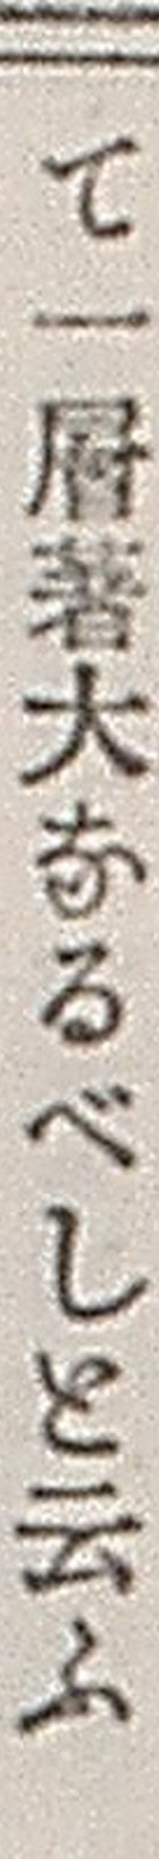て一層著大なるべしと云ふ
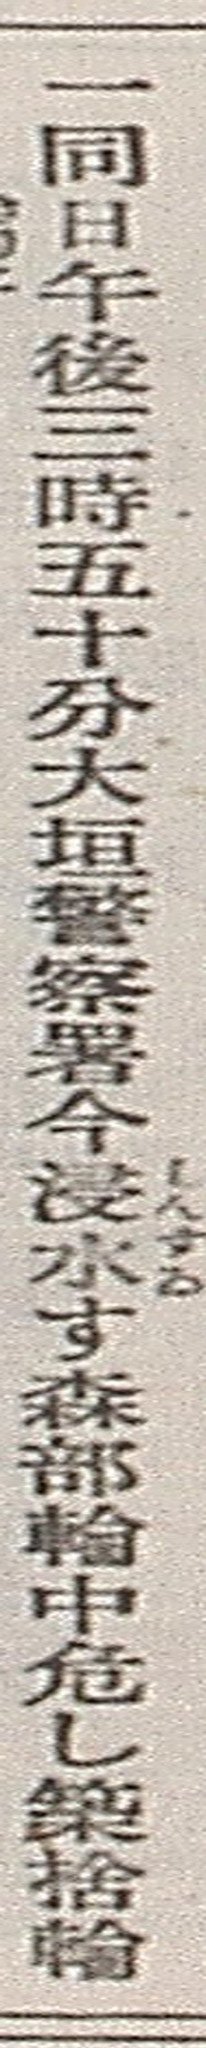一同日午後三時五十分大垣警察署今浸水す森部輪中危し築捨輪
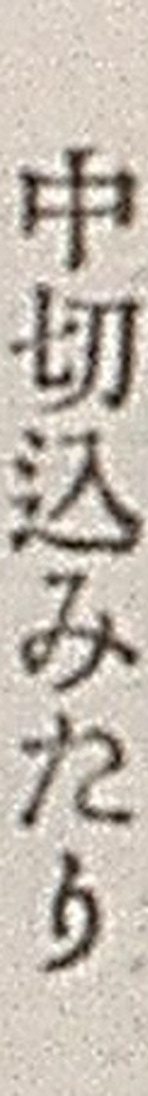中切込みたり
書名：風俗畫報臨時増刊第百二十六號　洪水被害録（中）
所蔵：東京大学地震研究所図書室 Earthquake Research Institute Library, The University of Tokyo, JAPAN
